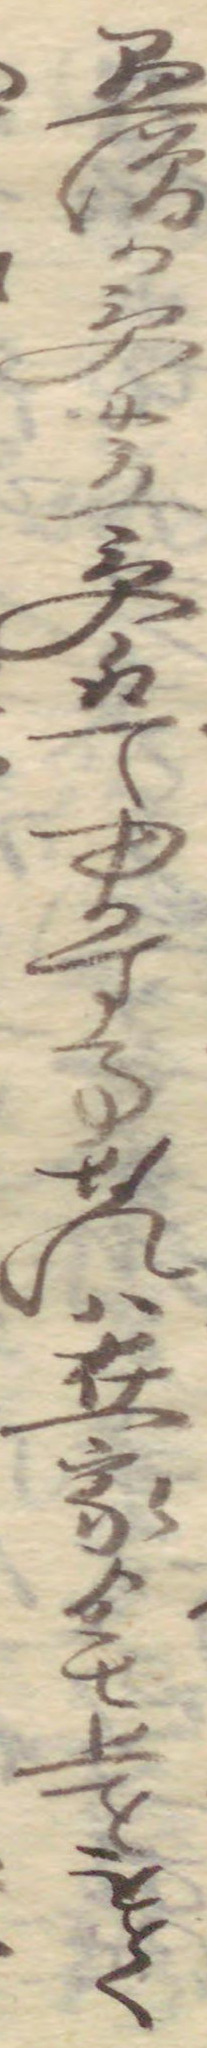愚僧か受に立受取てゆるす事なれは在家ゟ其上をもとく
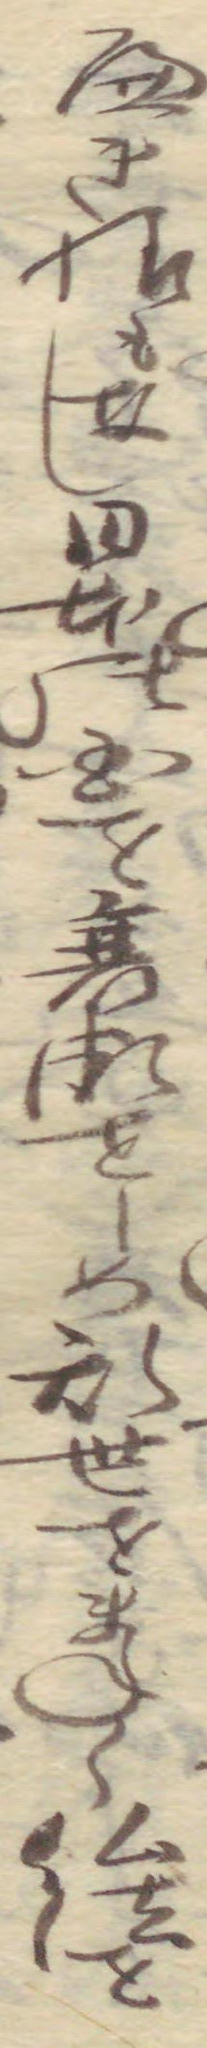へき様もなし日本の国を衰微せしめ乱世をまねく仏法を
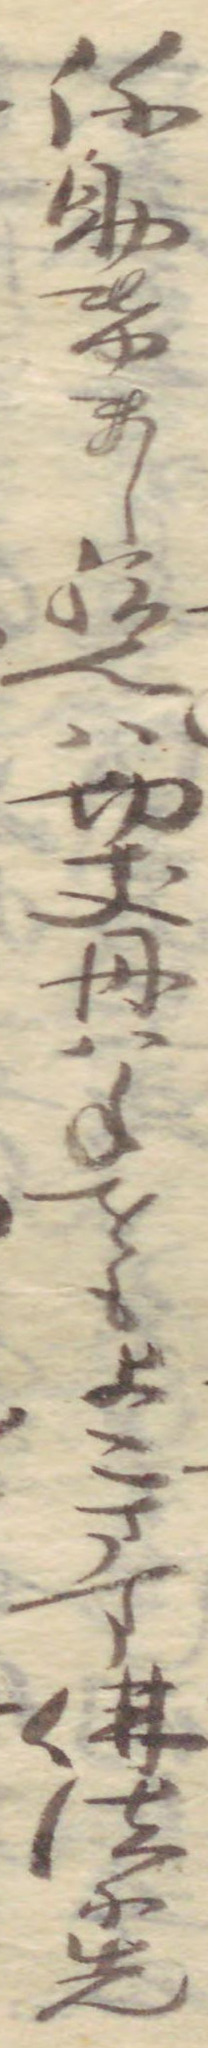弥助けまし給へは切支丹は手をもよこさす仏法に先
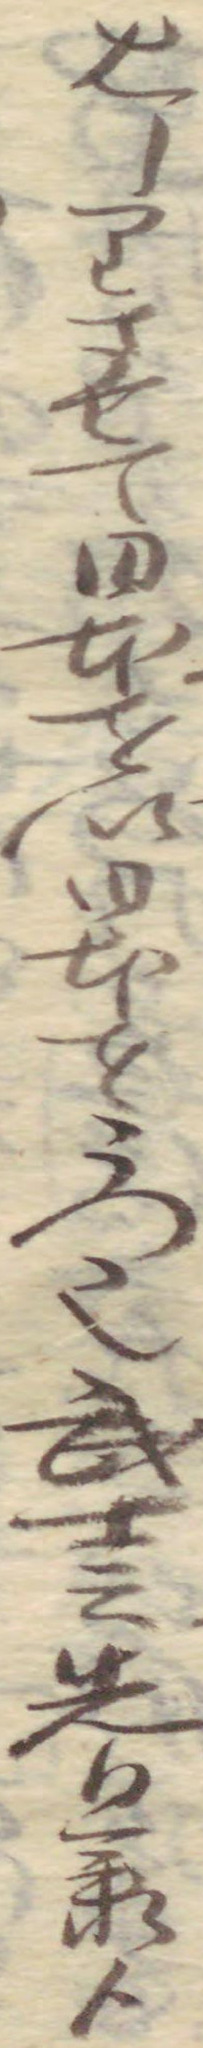はしりさせて日本を以日本をうつ也武士云先日承候
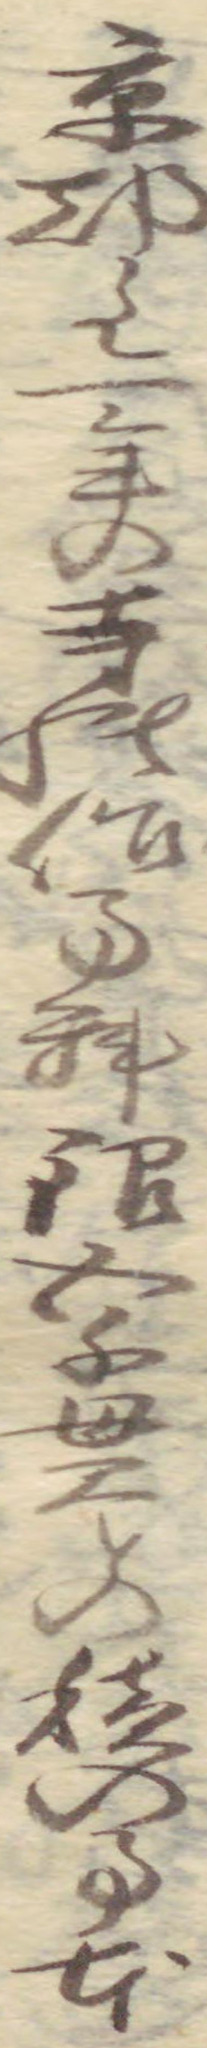京都ニて一年の寺の作事料銀五千貫との積の事本
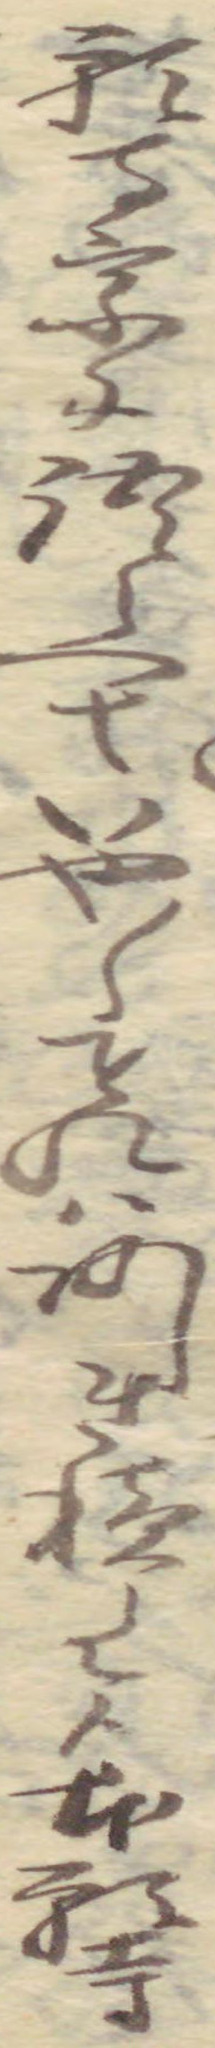願寺宗に語候へはいや〳〵それはあしき積ニて候本願寺
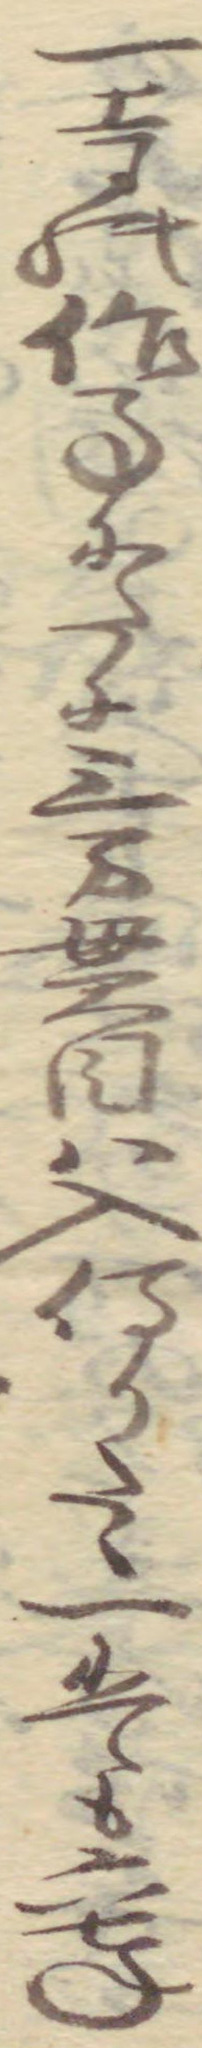一寺の作事にたに三万貫目は入侍りたゝ一にても六七年
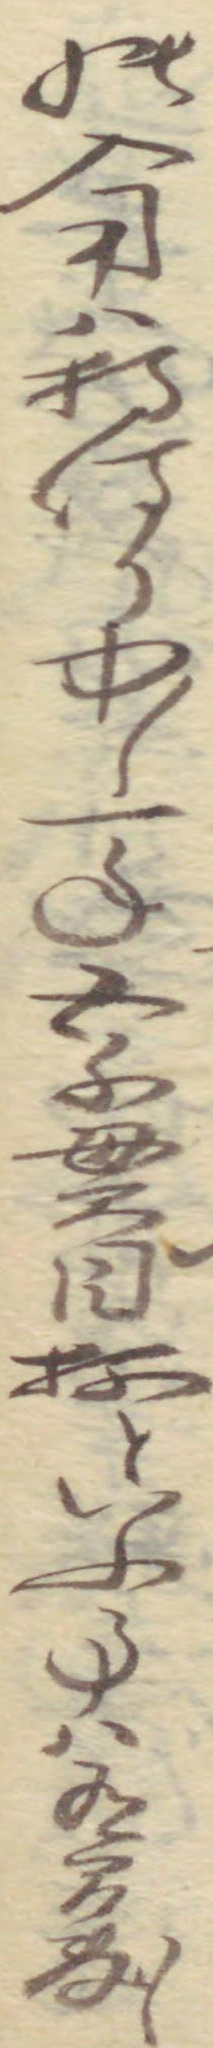の入用は持侍り中〳〵一年五千貫目等といふ事は有間敷〳〵
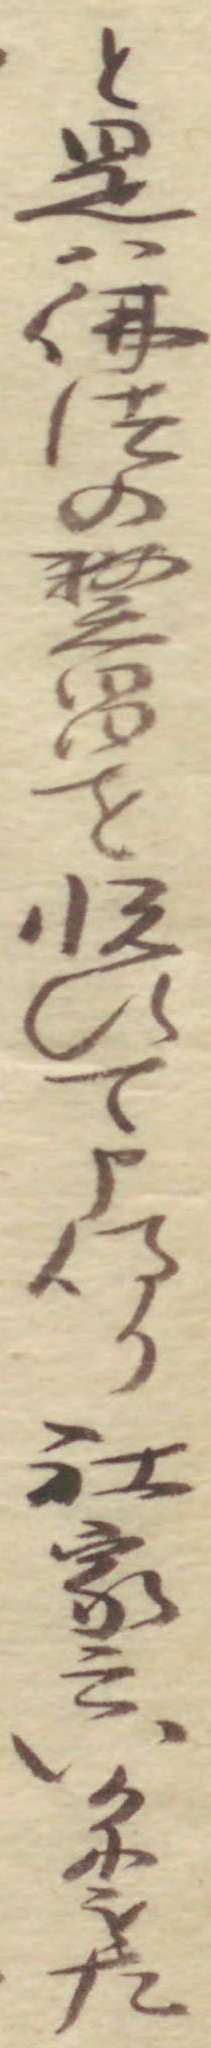と是は仏法の繁昌を悦ひて申侍り社家云いかにも左
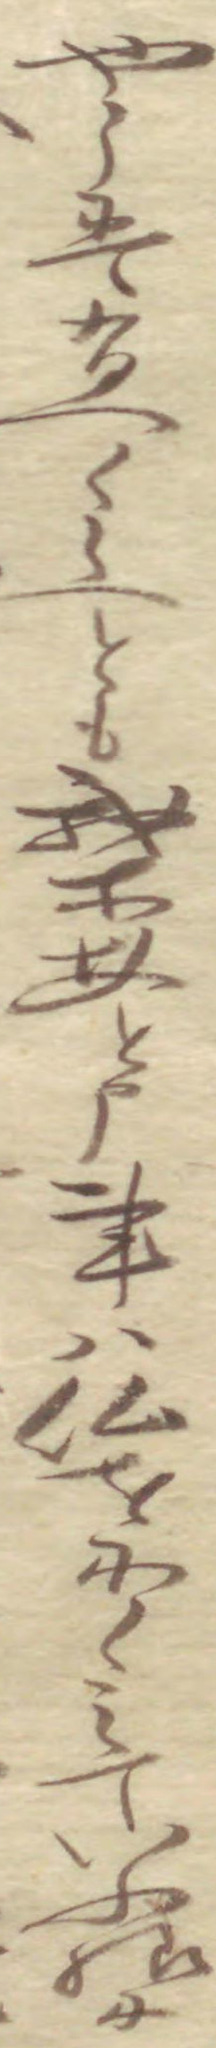やうにて有へく候へとも我等なと申事は仏をにくみていふ様に
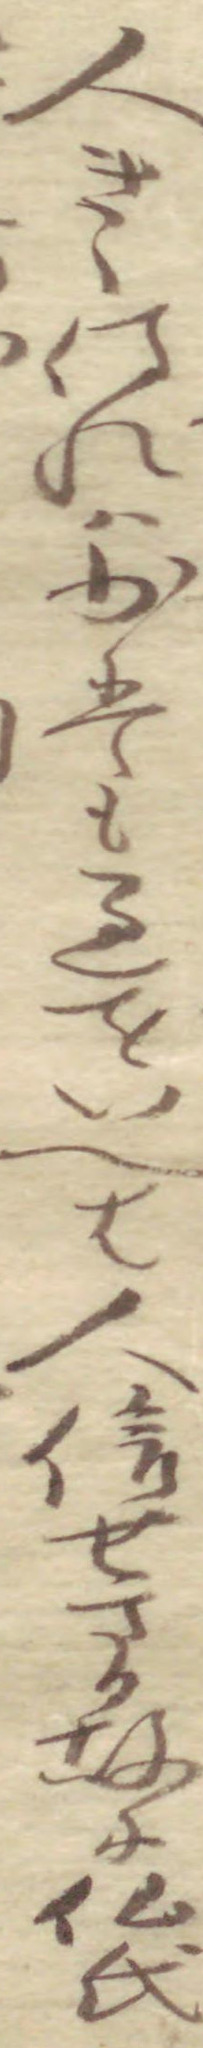人きゝ侍れは少にても過をいへは人信せさる故に仏氏
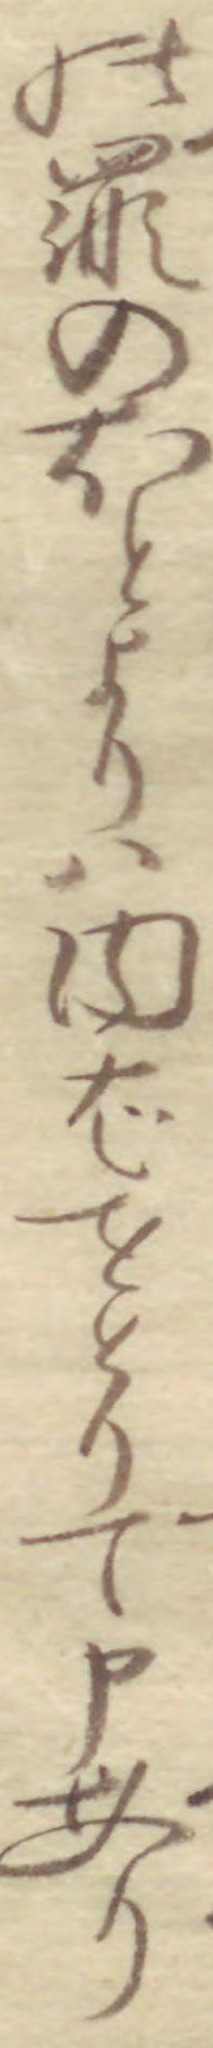の罪のほとよりは内ばをとりて申なり
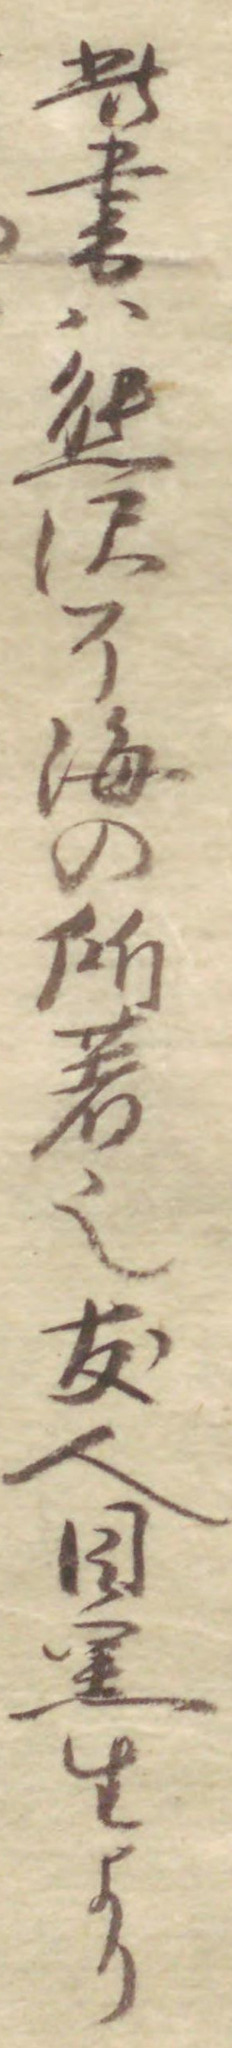此書は熊沢了海の所著也友人目黒生より
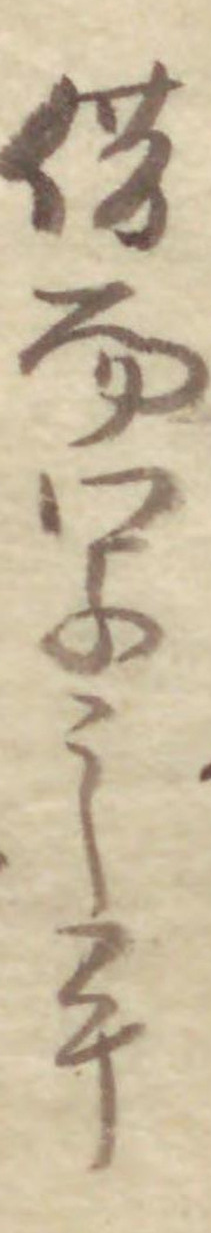借而写之畢
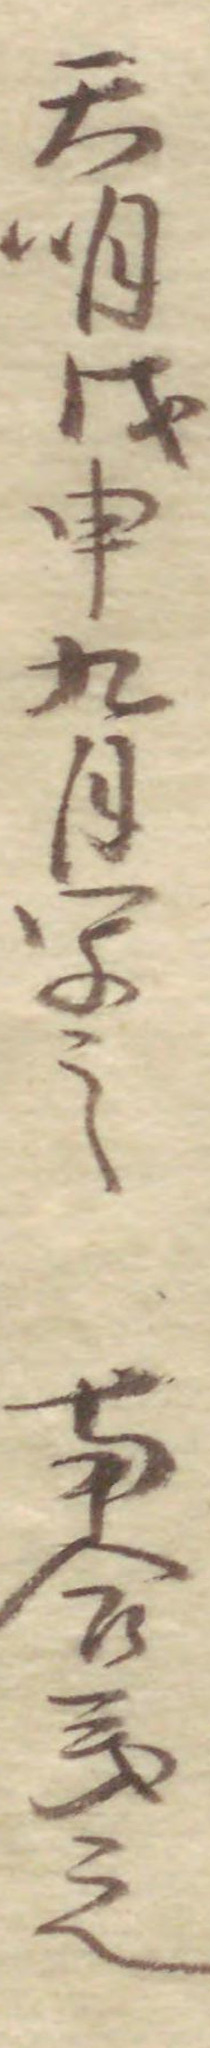天明戊申九月写之南合義之
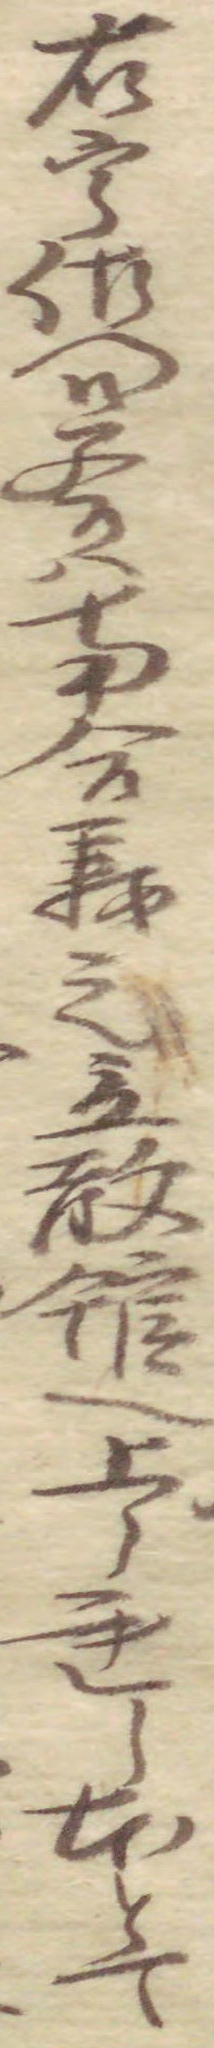右宇佐問答は南合義之立教館へ上られし本とて
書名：鶯宿雑記. 巻263-264
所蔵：国立国会図書館 National Diet Library, JAPAN
